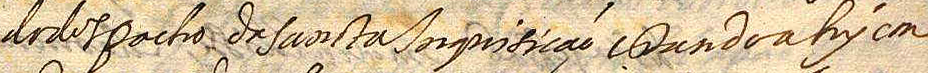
do despacho da Sancta Inquisiçaõ, estando ahy em
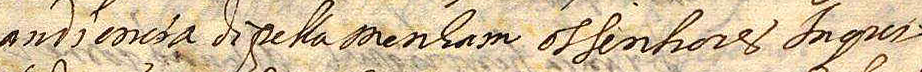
audiencia de pella menham os senhores Inqui
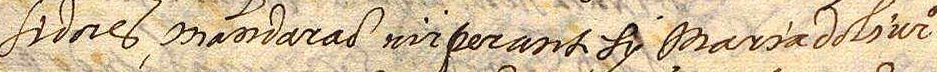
sidores, mandaraõ uir perante sy Maria doliura
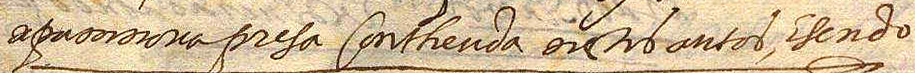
xpam noua presa Contheuda nestes autos, E sendo
